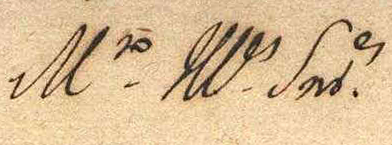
M.to Ill.es Snr.es
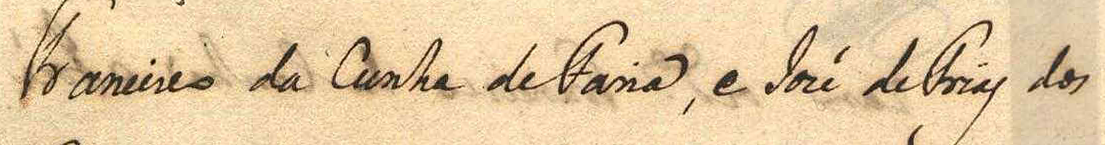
Francisco da Cunha de Faria, e Iozé de Frias dos
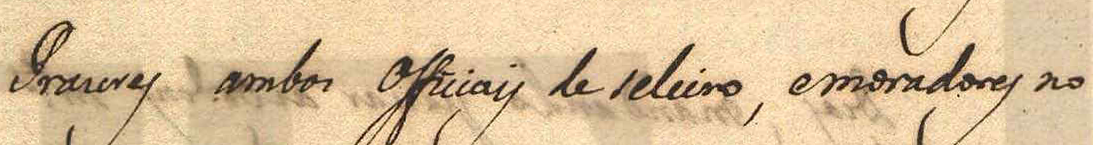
Prazeres ambos Officiais de seleiro, e moradores no
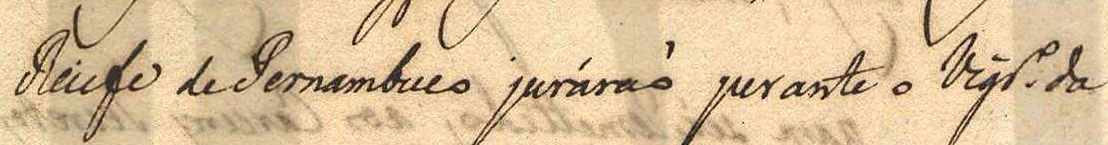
Recife de Pernambuco juráraõ perante o Vigr.o da
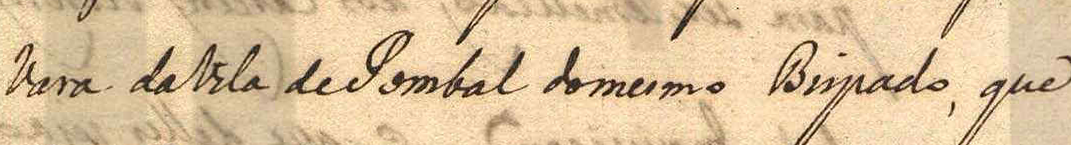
Vara da Vila de Pombal do mesmo Bispado, que
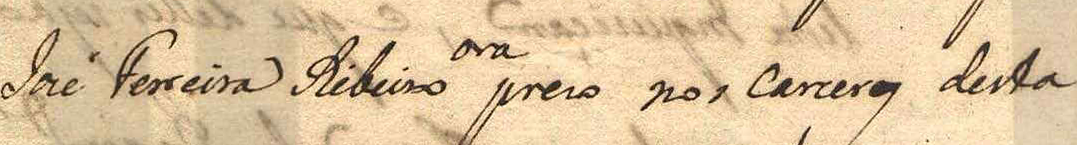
Iozé Ferreira Ribeiro ora prezo nos Carceres desta
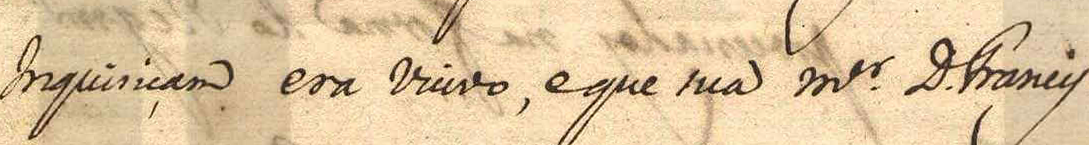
Inquisiçam era viuvo, e que sua m.er D. Francis
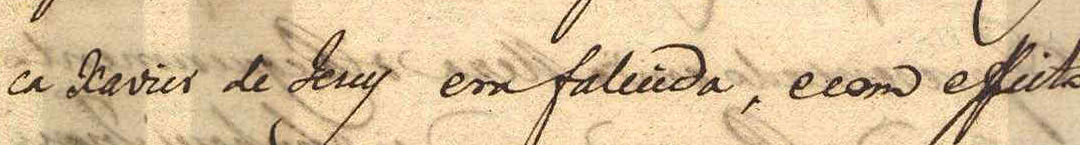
ca Xavier de Iezus era falecida, e com effeito
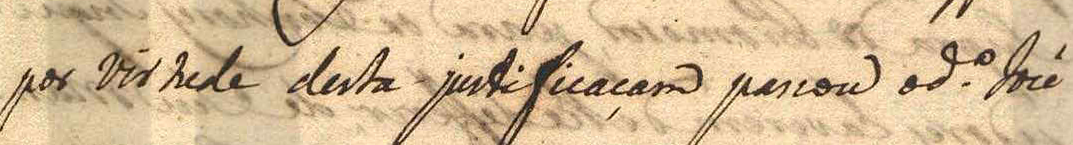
por virtude desta justificaçam passou o d.o Iozé
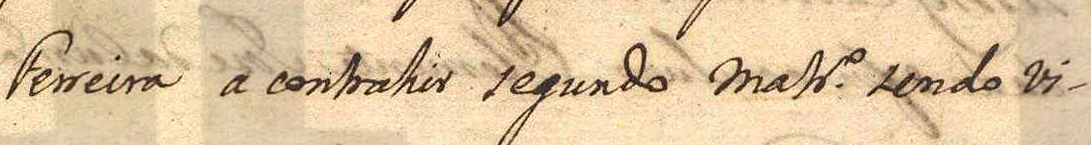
Ferreira a contrahir segundo matr.o sendo vi
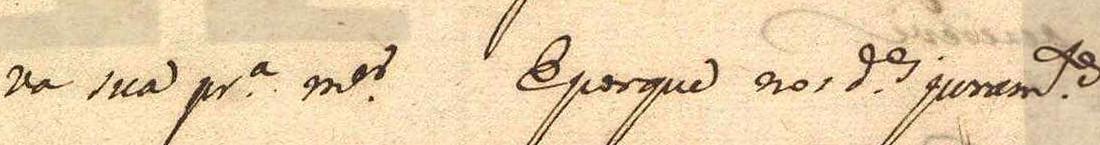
va sua pr.a m.er E porque nos d.os juram.tos
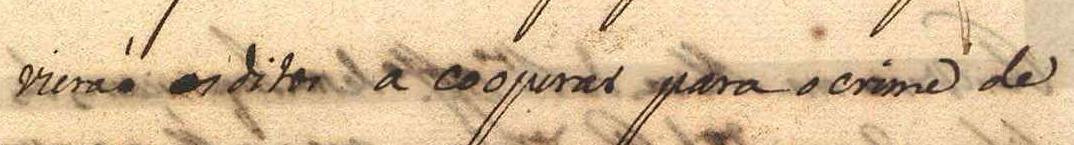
vieraõ os ditos a cooperar para o crime de
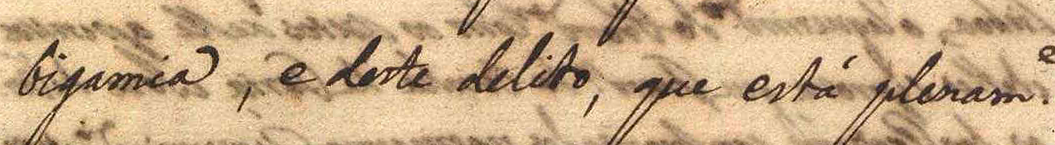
bigamia, e deste delito, que está plenam.e
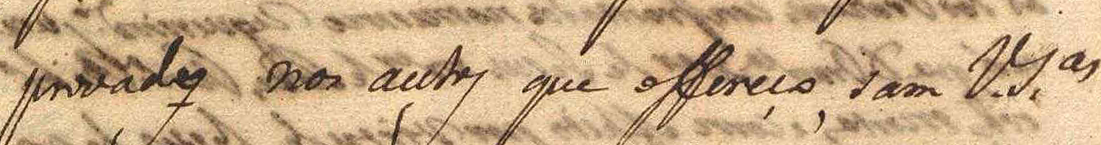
provados nos autos que offereço, sam V.S.as
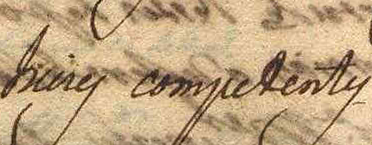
Iuizes competentes.
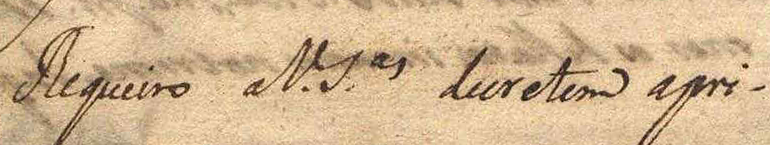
Requeiro a V.S.as decretem a pri
